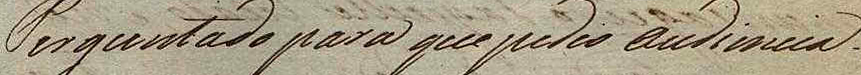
Perguntado para que pedio audiencia.
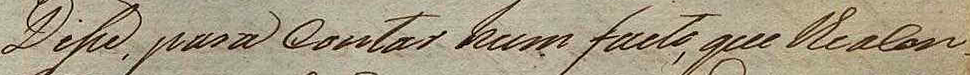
Disse, para contar hum facto, que lhe acon
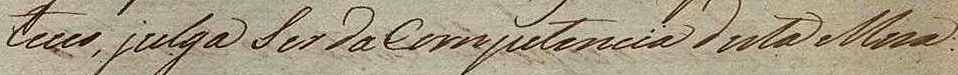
teceo, julga Ser da competencia desta Mesa:
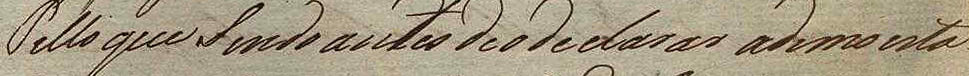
Pello que sendo antes de o declarar admoesta
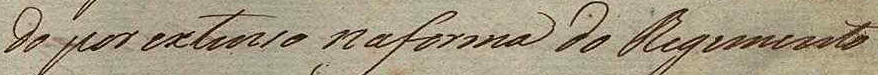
do por extenso na forma do Regimento
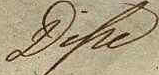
Disse
